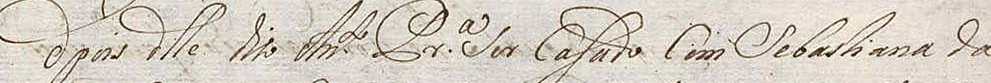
dpois dlle dito An.to Pr.a ser Casado Com Sebastiana da
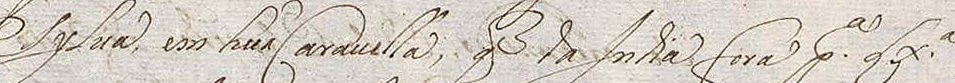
Sylua, em huā Carauella, q̄ da India fora p.a Lx.a
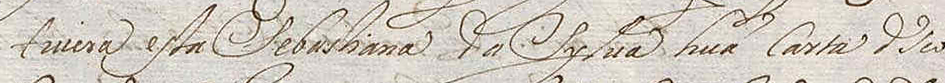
tivera esta Sebastiana da Sylua huā Carta d seo
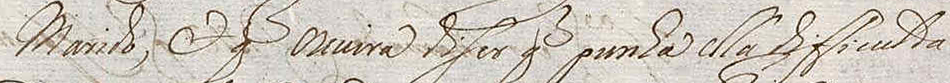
Marido, E q̄ ouuira diser q̄ punha ella difficulda
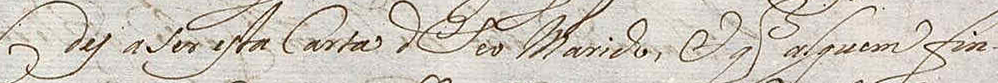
des a ser esta Carta d Seo Marido, E q̄ alguem fin
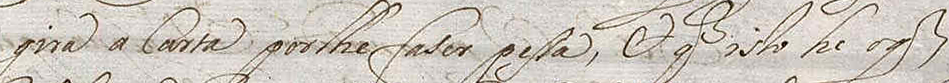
gira a Carta por lhe faser pessa, E q̄ isto he o q̄
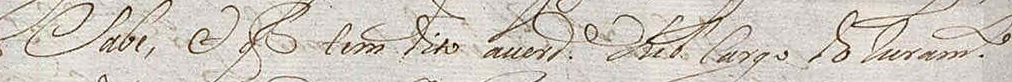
Sabe, E q̄ tem dito a verd.e Sub Cargo do Juram.to
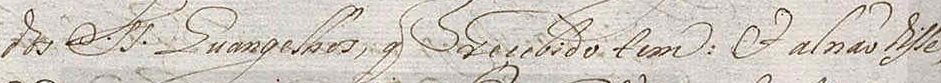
dos .SS, Evangelhos, q̄ reçebido tem: E al não disse,
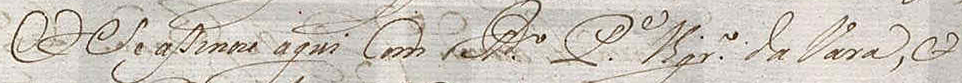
et se assinou aqui Com o Rd.o P.e Vigr.o da Vara, et
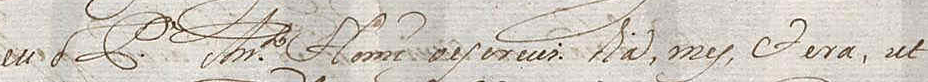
eu o P.e An.to Homē o escreui dia, mesm, E era, ut
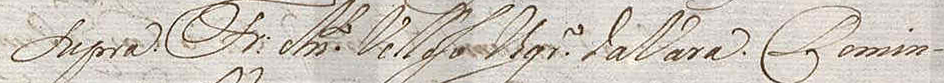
supra. Fr: An.to Velloso Vigr.o da Vara. Domin
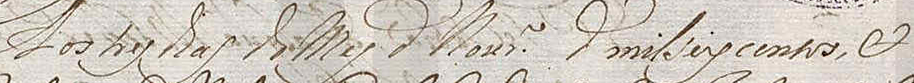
Aos tres dias do Mes d Novr.o d mil seiscentos, et
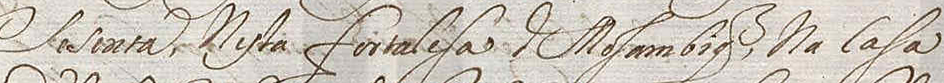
Sesenta, Nesta fortalesa d Mosambiq̄, na Casa
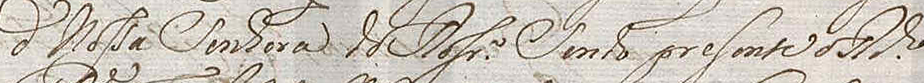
d Nossa Senhora do Rosr.o Sendo presente o R.do
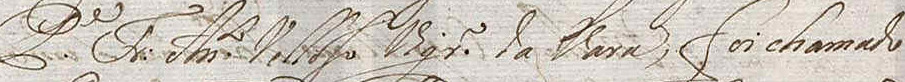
P.e Fr: An.to Velloso Vigr.o da Vara, foi chamado
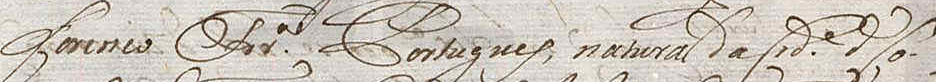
Lorenco Frr.a Portugues, natural da Cid.e d Co
